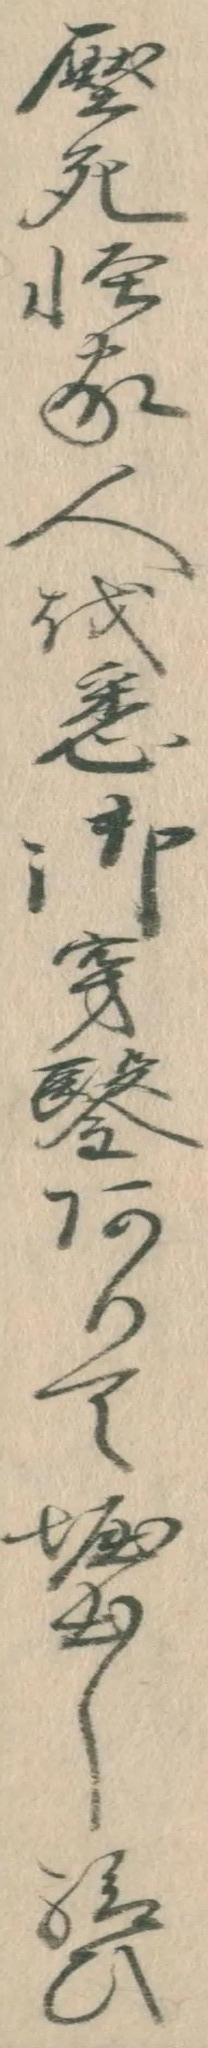圧死怪我人を悉く御穿鑿ありて堀出し給ひ

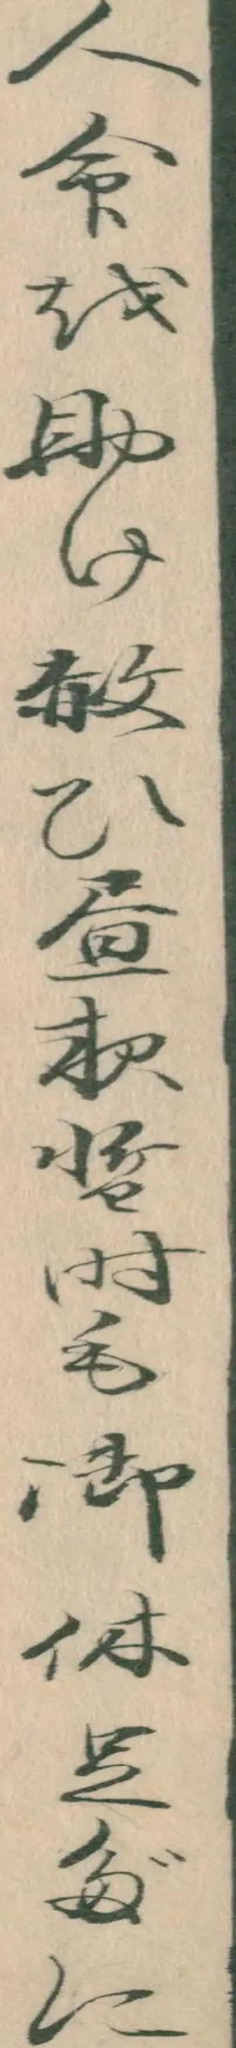人命を助け赦ひ昼夜暫時も御休足だに
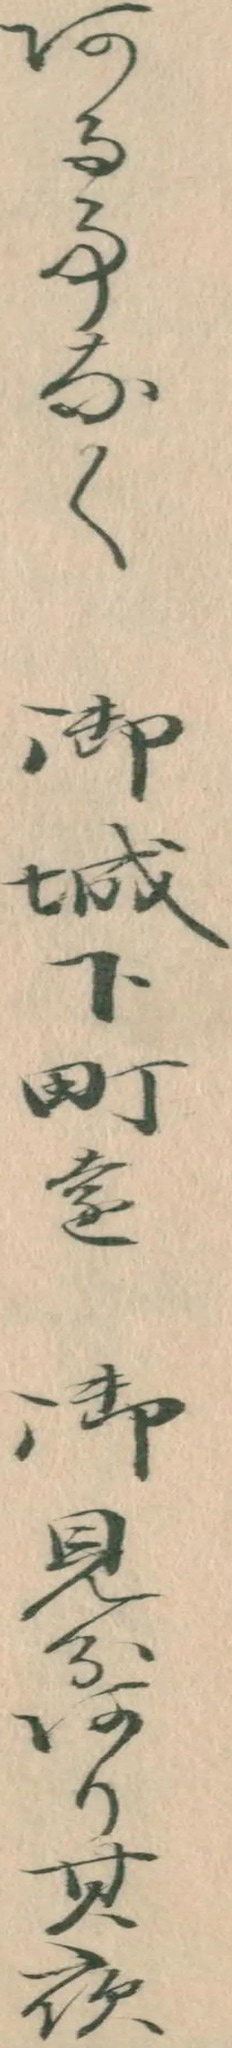ある事なく御城下町を御見分あり其夜
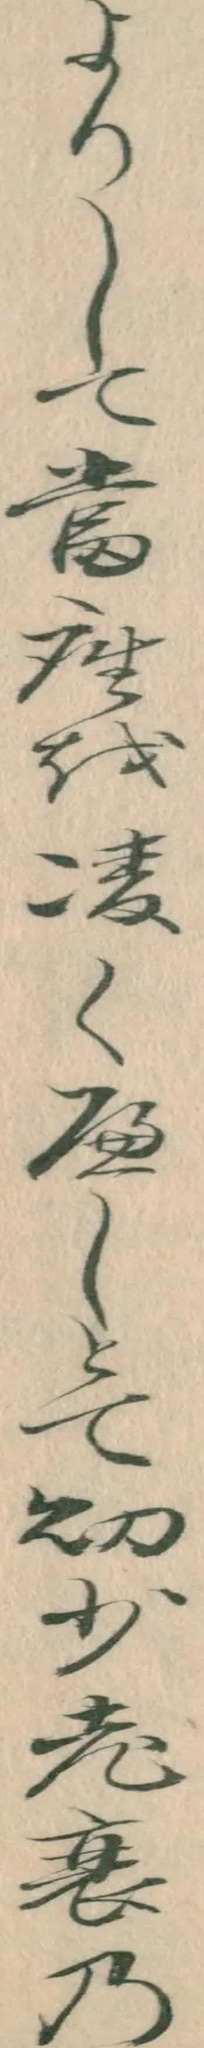よりして当座を凌くべしとて幼少老衰の
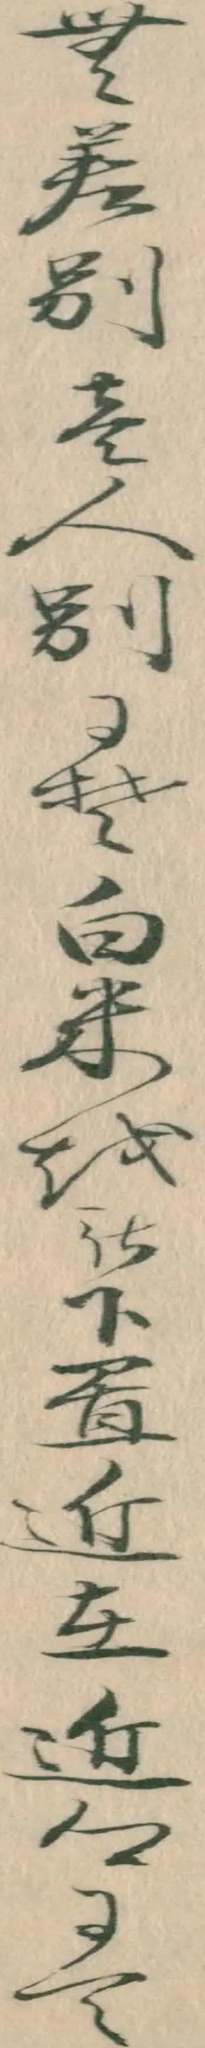無差別壱人別にそ白米を被下置近在近郷にて
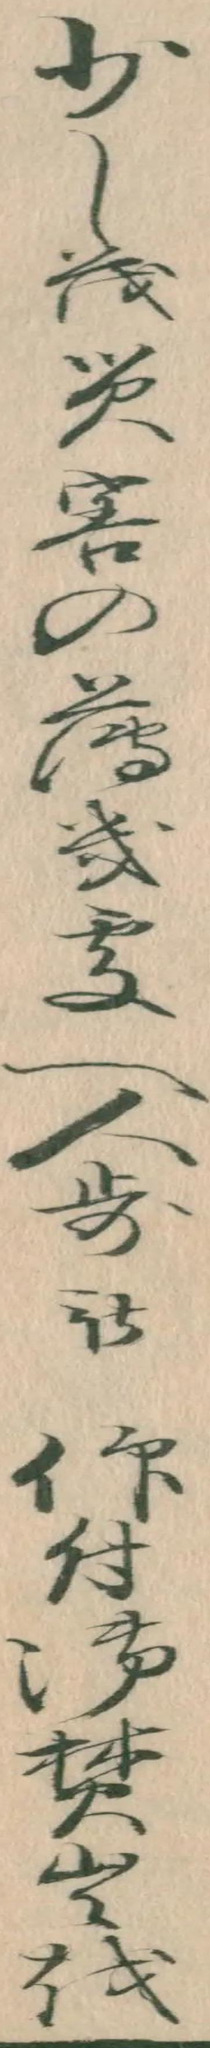少しも災害の薄き処へ人歩被仰付御焚出を
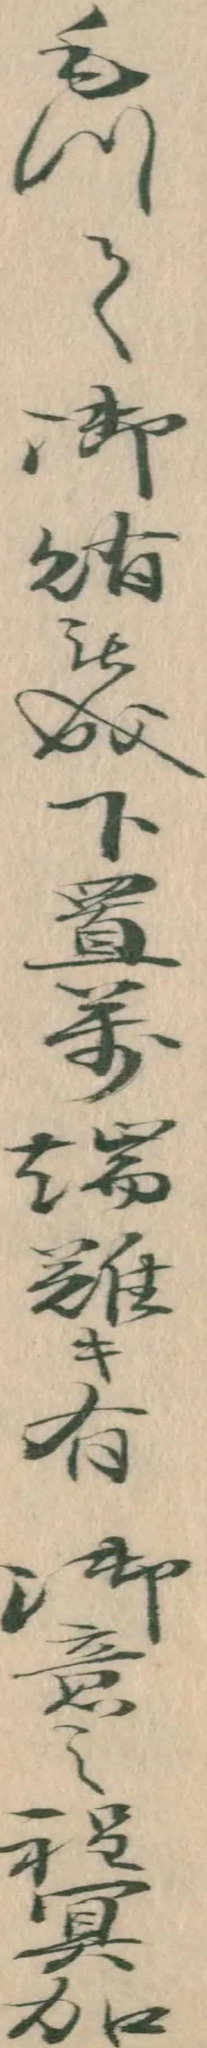もつて御賄被成下置万端難キ有御意之程冥加
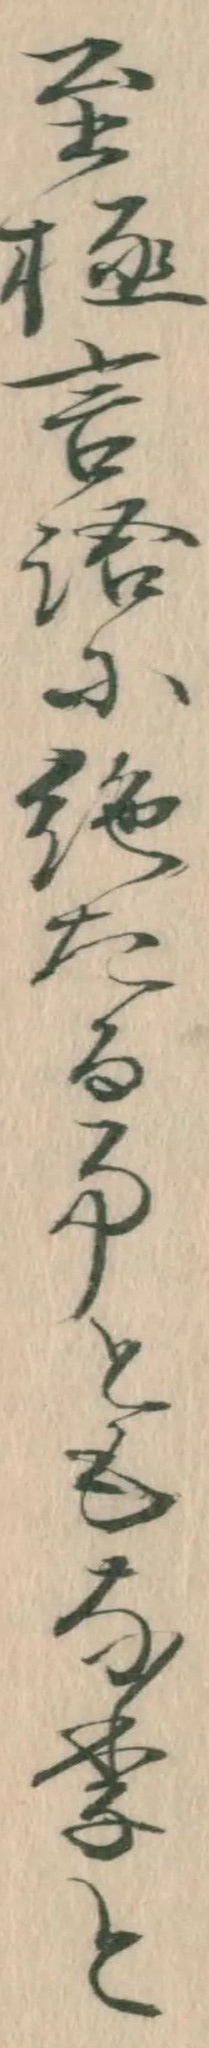至極言語に絶たる事ともなりと
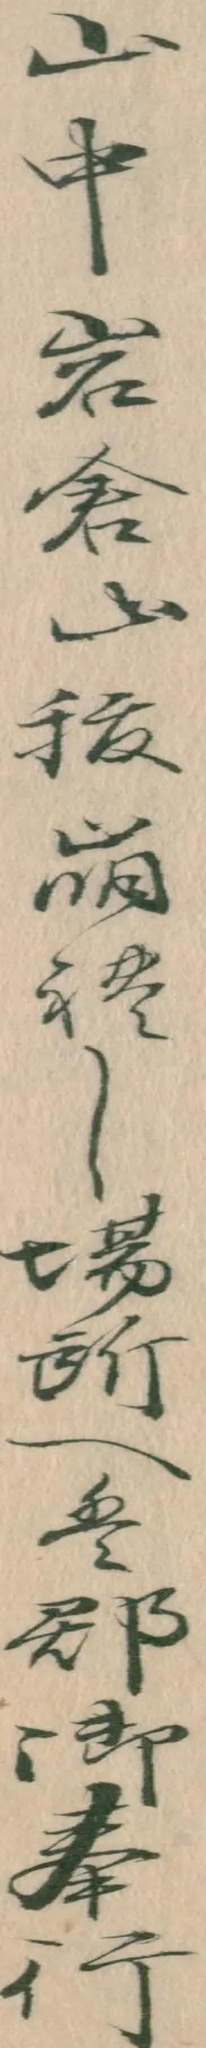山中岩倉山抜崩れし場所へは郡御奉行
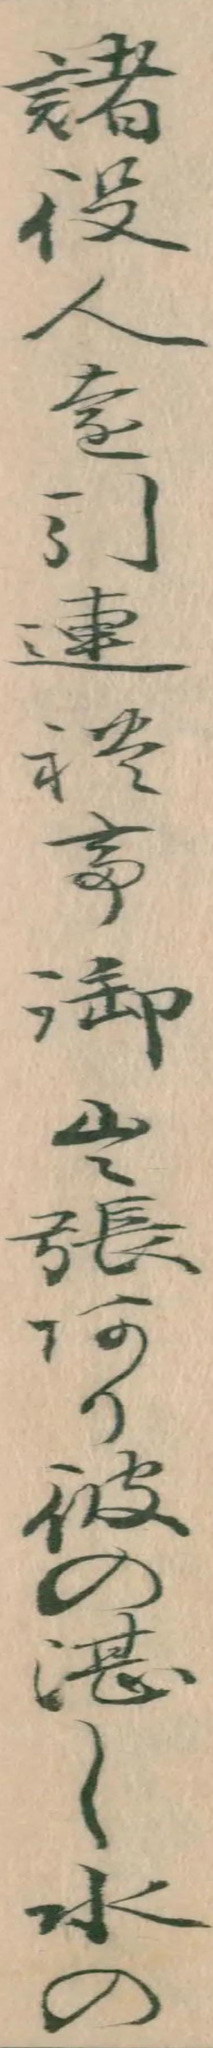諸役人を引連れて御出張あり彼の湛し水の
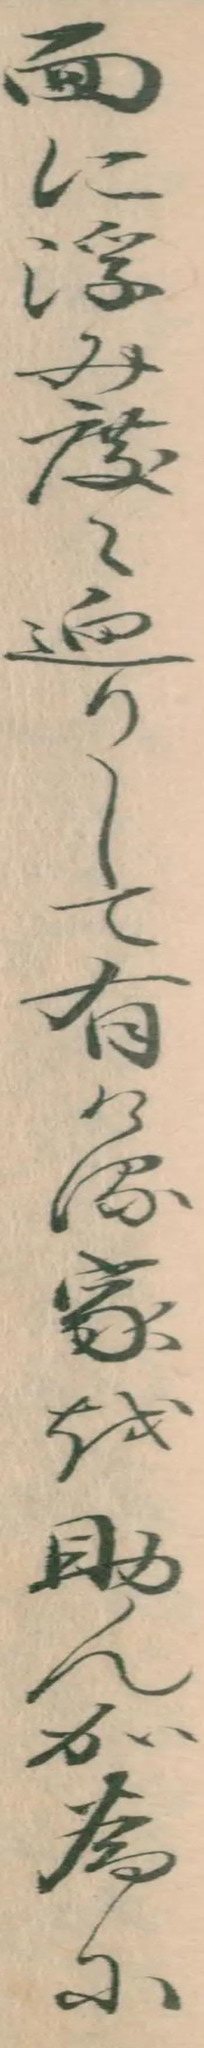面に浮み度〻廻りして有ける家を助んか為に
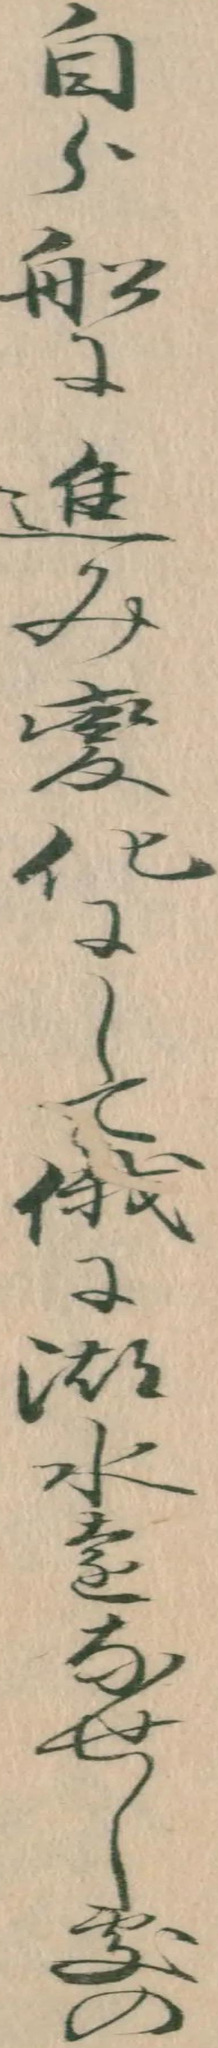自ら船に進み変化にして俄に湖水をなせし処の
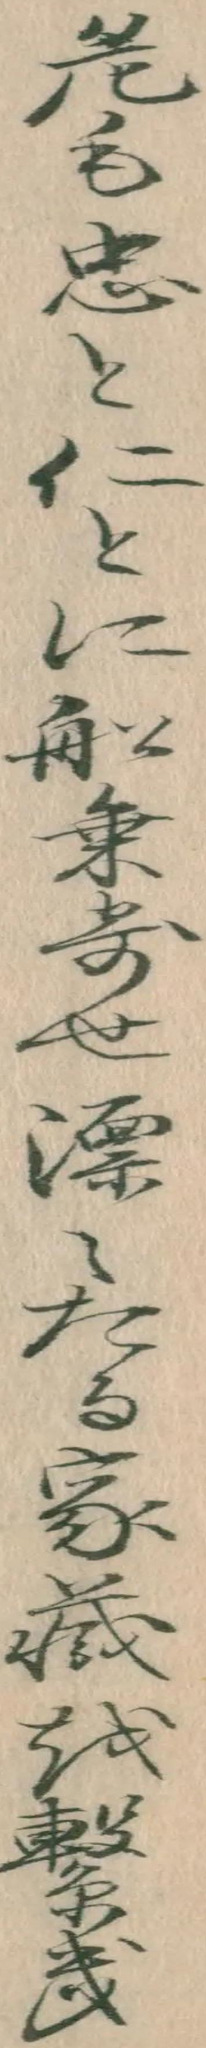危も忠と仁とに船乗寄せ漂〻たる家蔵を繋き
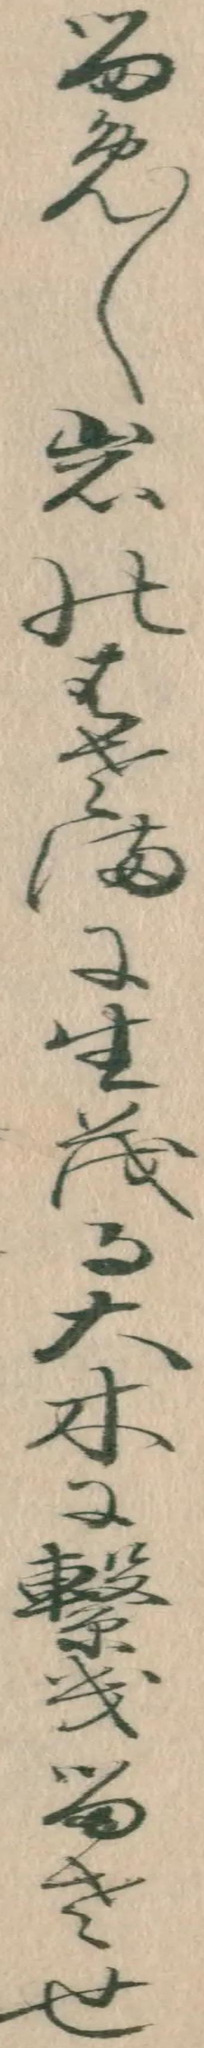留め〳〵岩のはさまに生茂る大木に繋き留させ
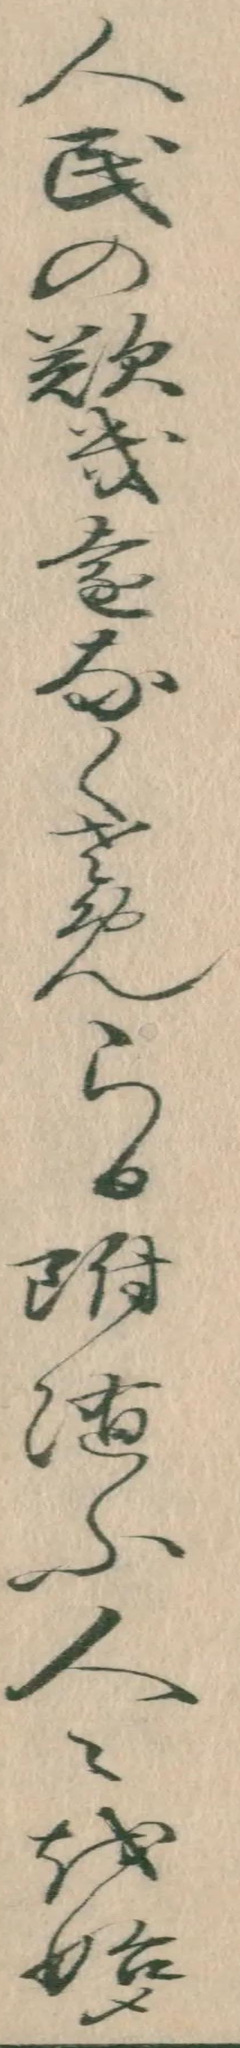人民の歎きをなくさめらる附随ふ人〻を始メ
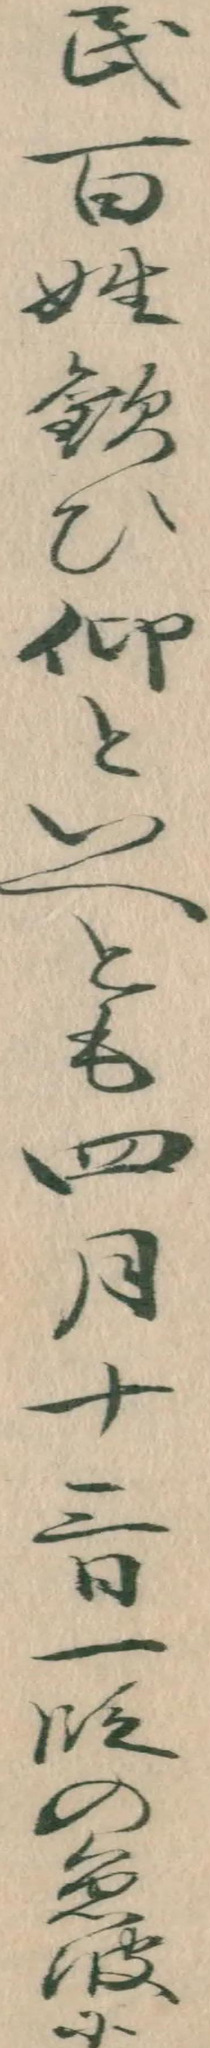民百姓歓ひ仰といへとも四月十三日一段の急波に
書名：俗語之種. [6]
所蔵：国立国会図書館 National Diet Library, JAPAN
